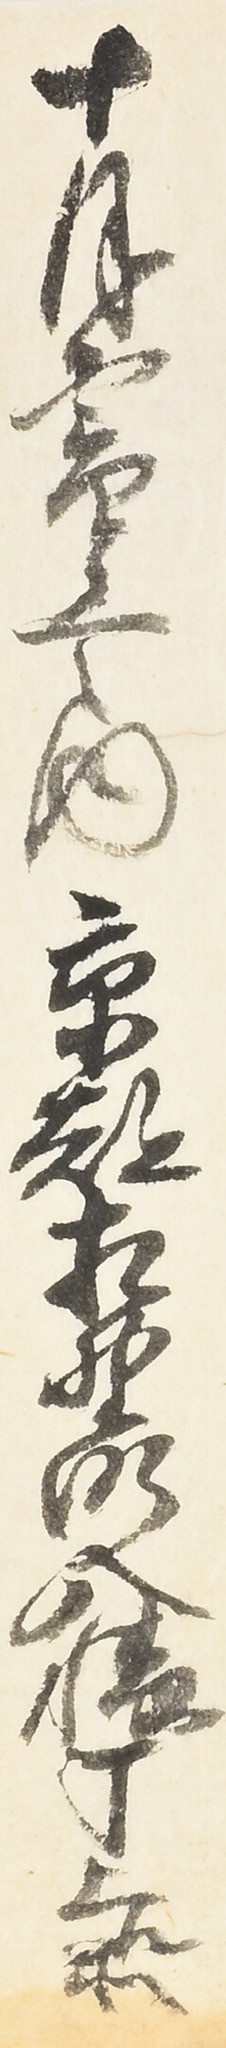十月書上之内京都相野町八幡町上ル所
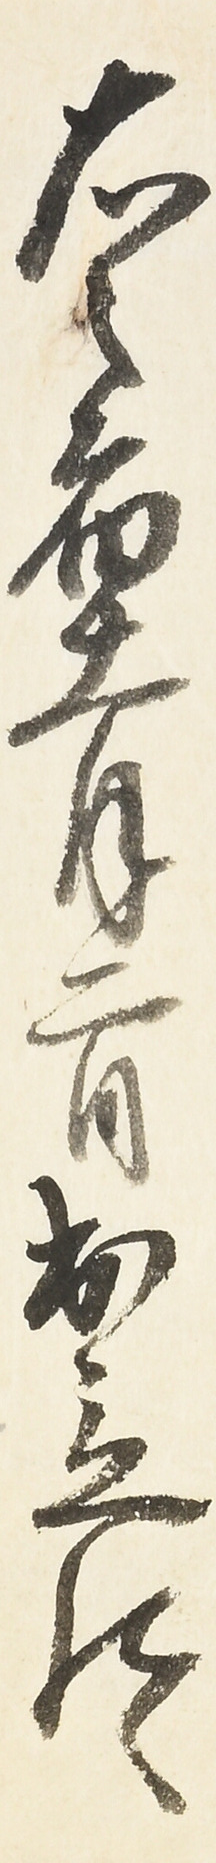右之者十一月二日出立仕候
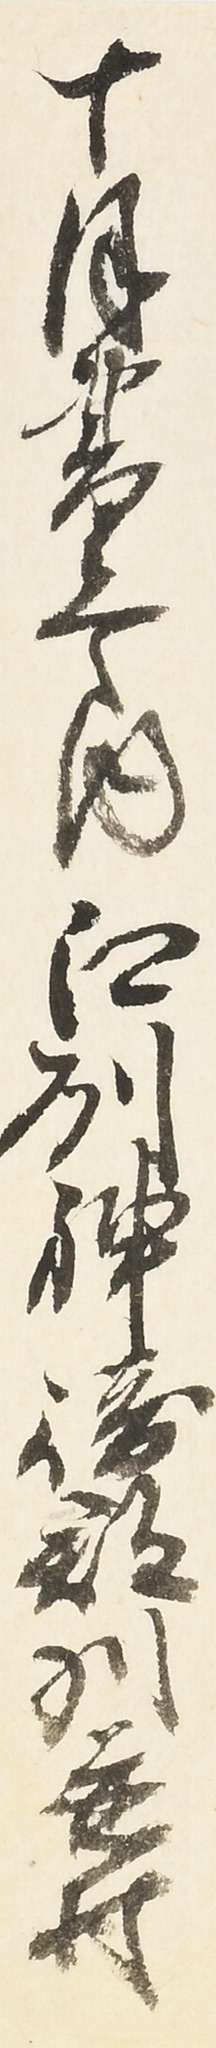十月書上之内江州神崎郡川並村
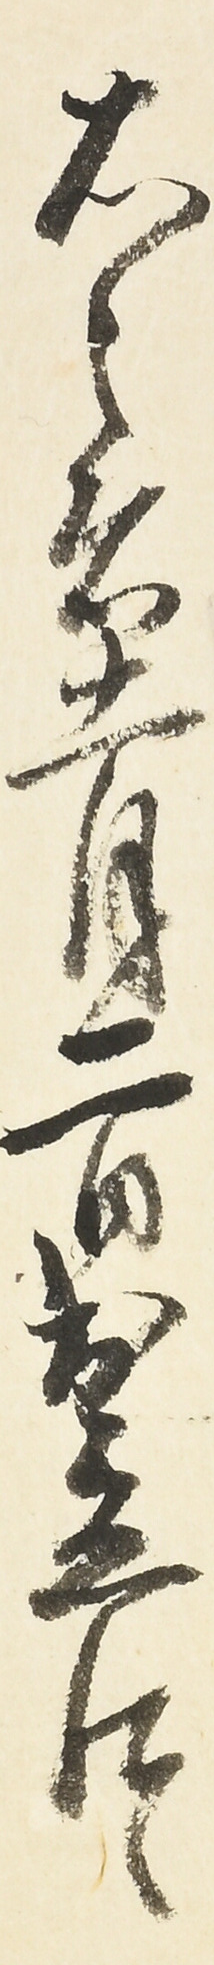右之者十一月二日出立仕候
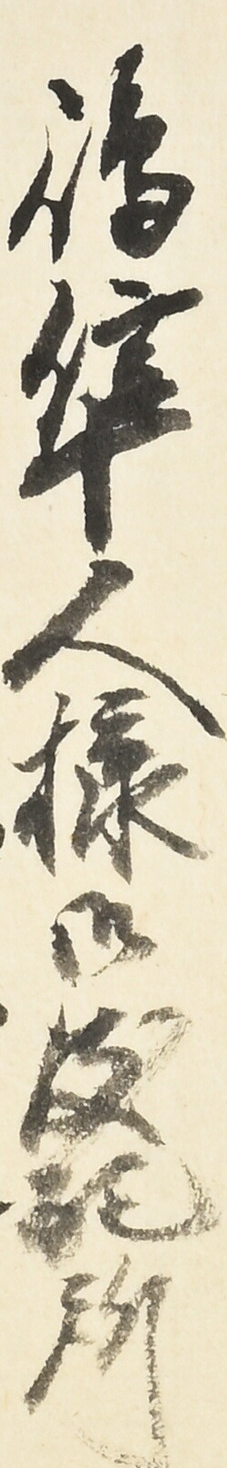嶋隼人様御支配所
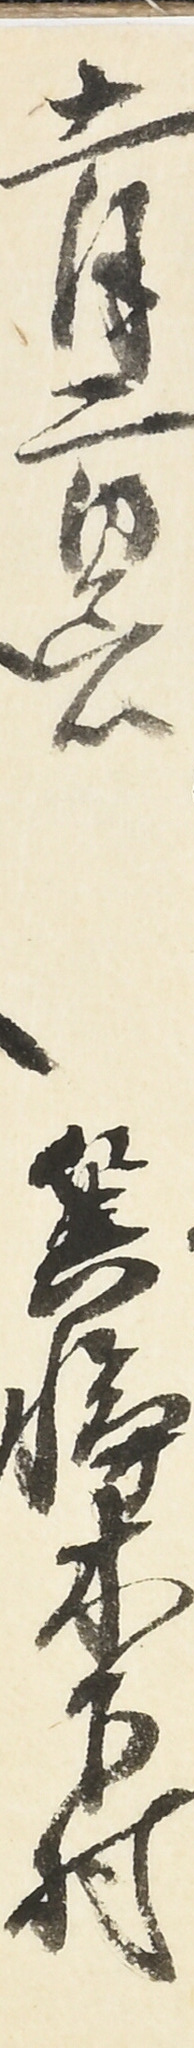十一月二日着箕輪木下村
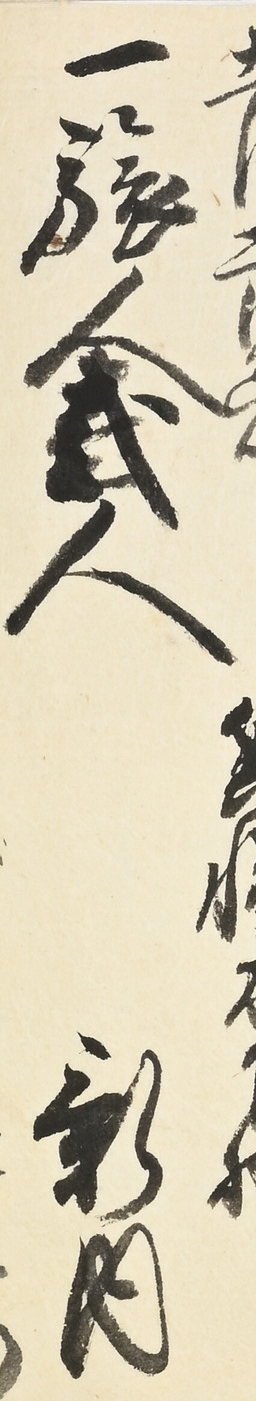一旅人弐人新内
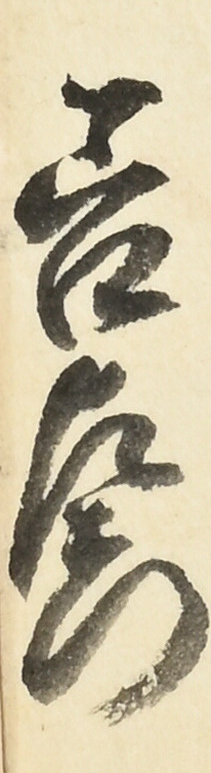善左衛門
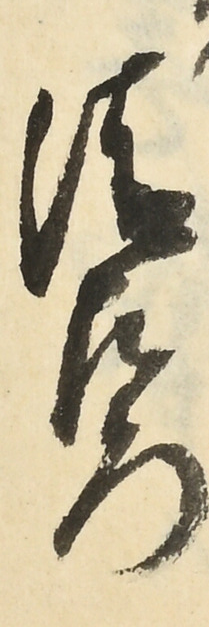善左衛門

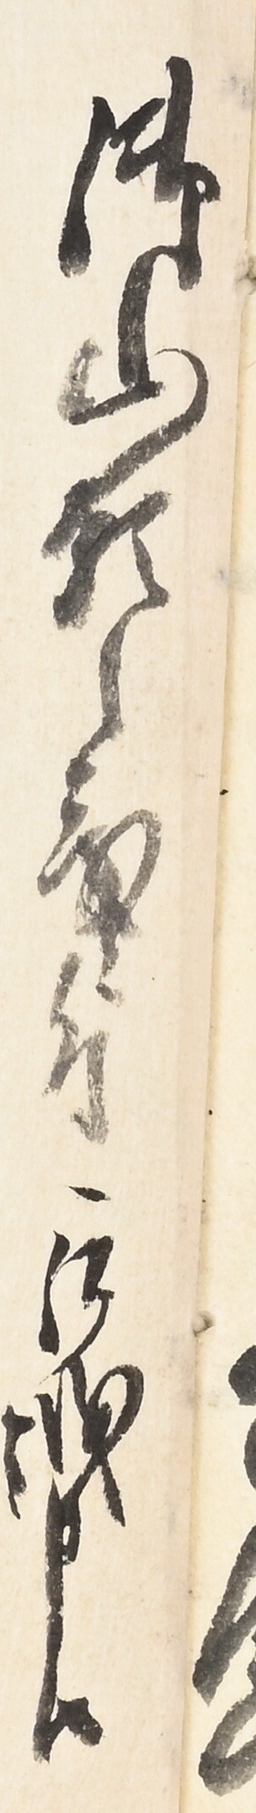御山願之義ニ付罷越申候
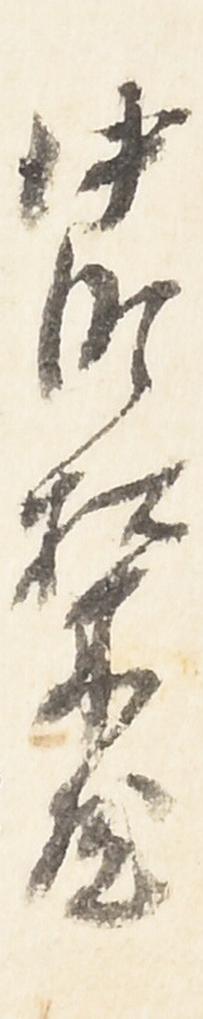中町松木屋
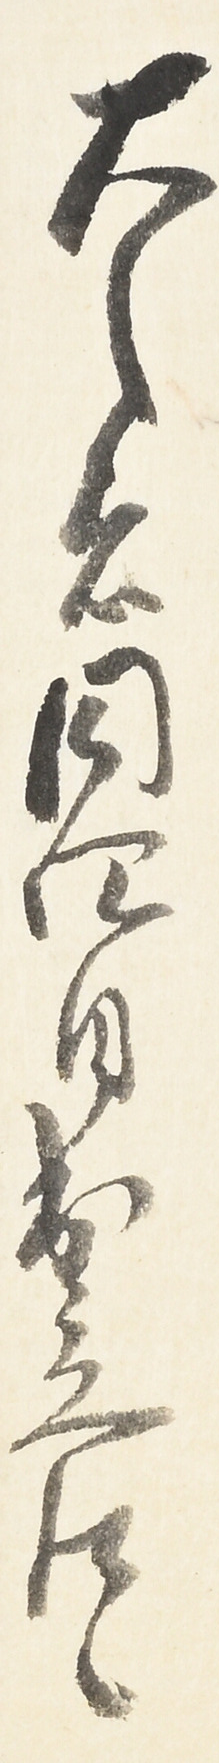右之者同四日出立仕候
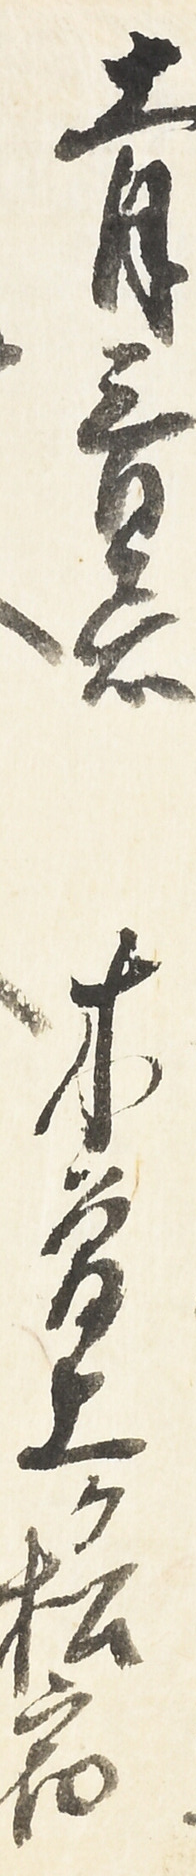十一月三日着木曽上ヶ松宿
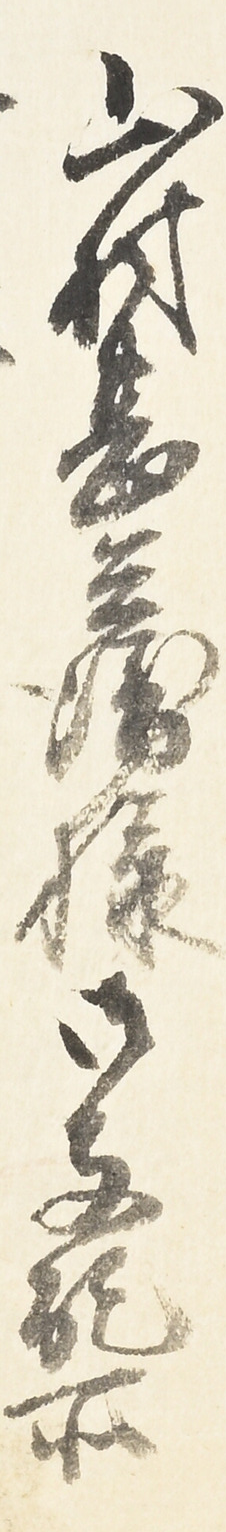山村甚兵衛様御支配所
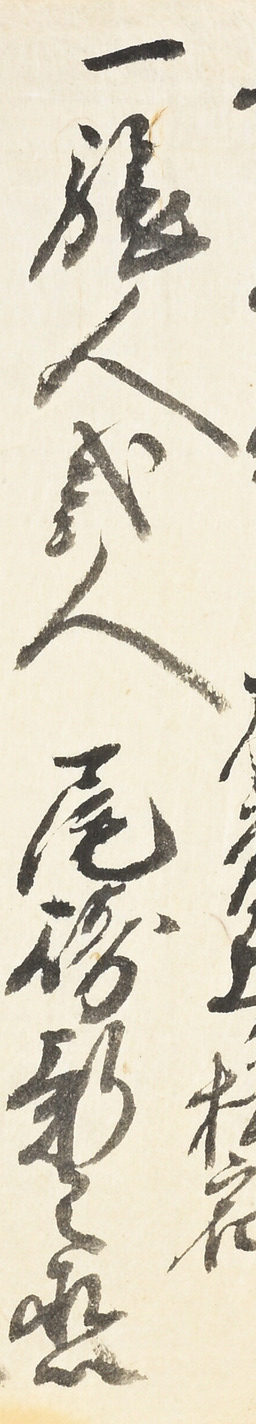一旅人弐人尾崎新之丞
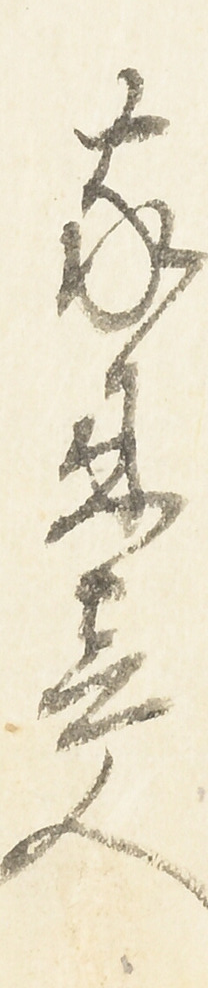家来壱人
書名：町中旅人泊控帳
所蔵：伊那市立高遠町図書館・合同会社AMANE
